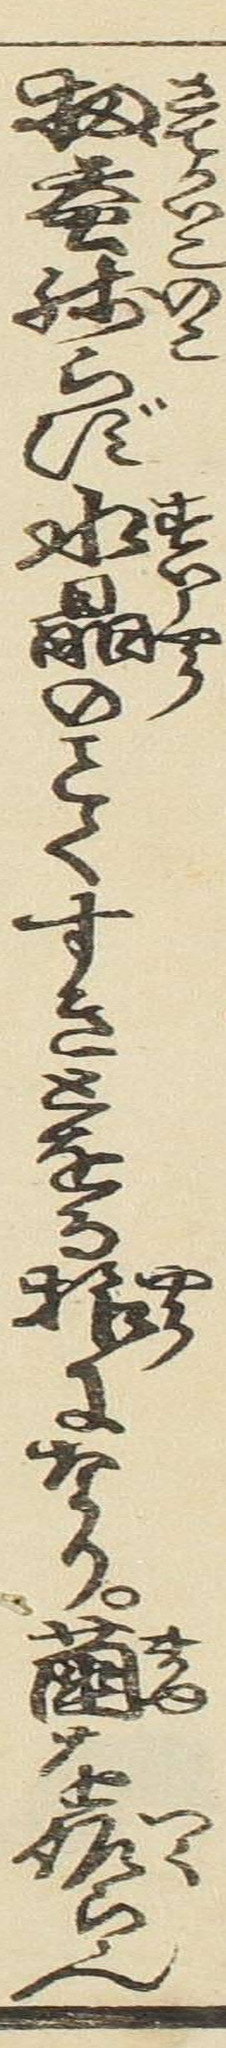扨蚕残らず水晶のことくすきとをる様になり。繭を作らん
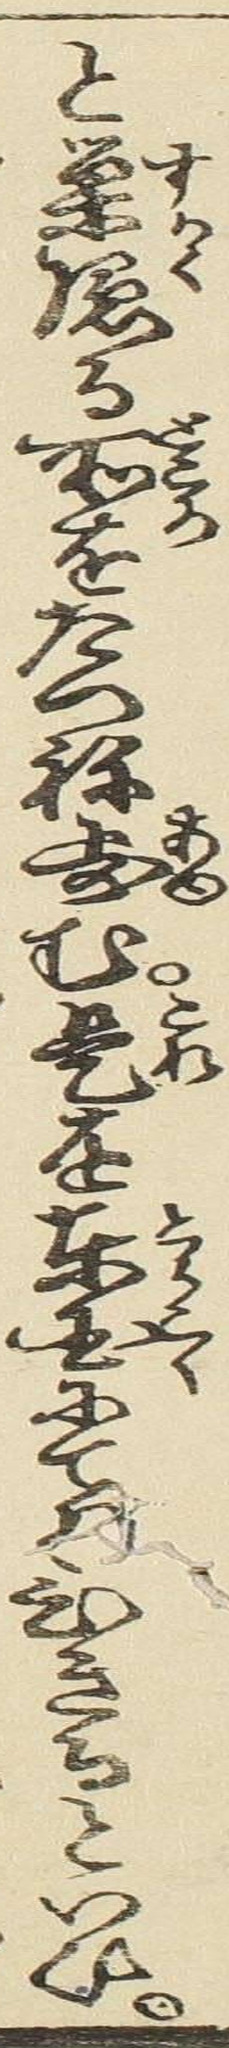と巣隠る所をたつね歩む。是を東国にてはひきるといひ⊙
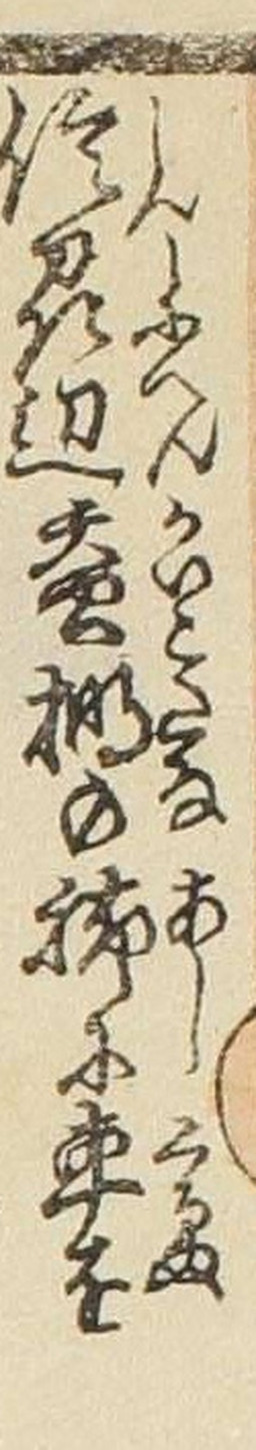信州辺蚕棚の脚に車を
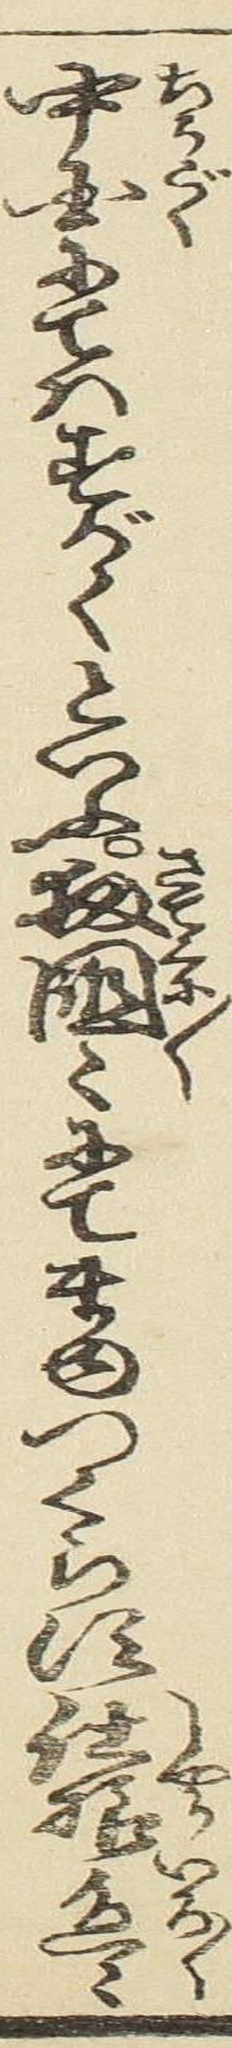中国にてはすがくといふ。扨国々にてまゆつくらす仕様色々
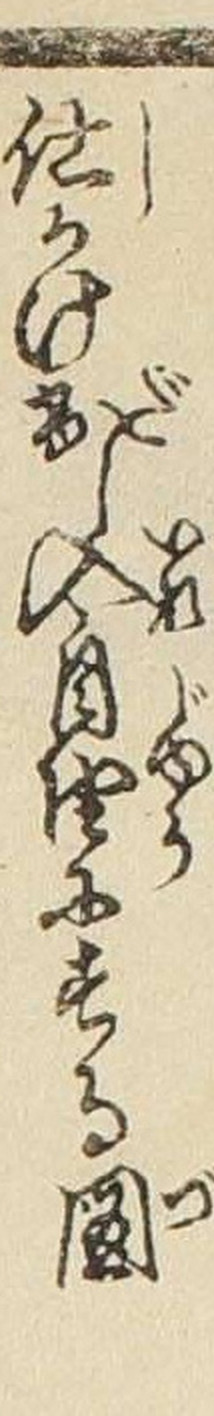仕かけ出し入自由にする図
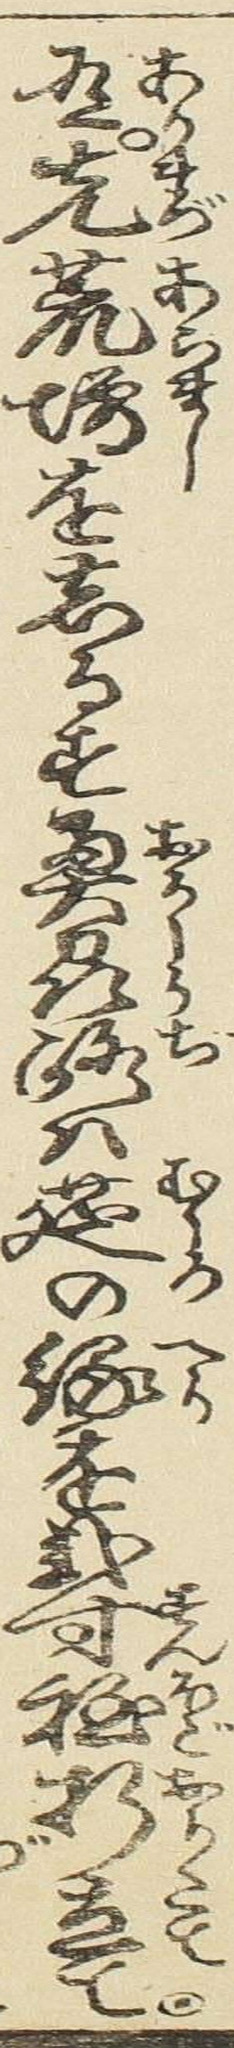有。先荒増をしるす奥州路は莚の縁を弐寸程折立て⊙
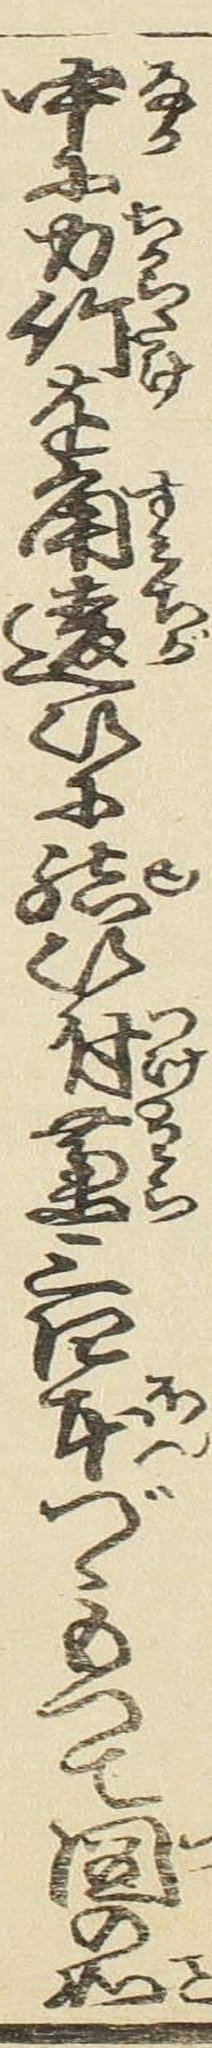中に力竹を角違ひに結ひ付。藁三四本づゝもつて図の如
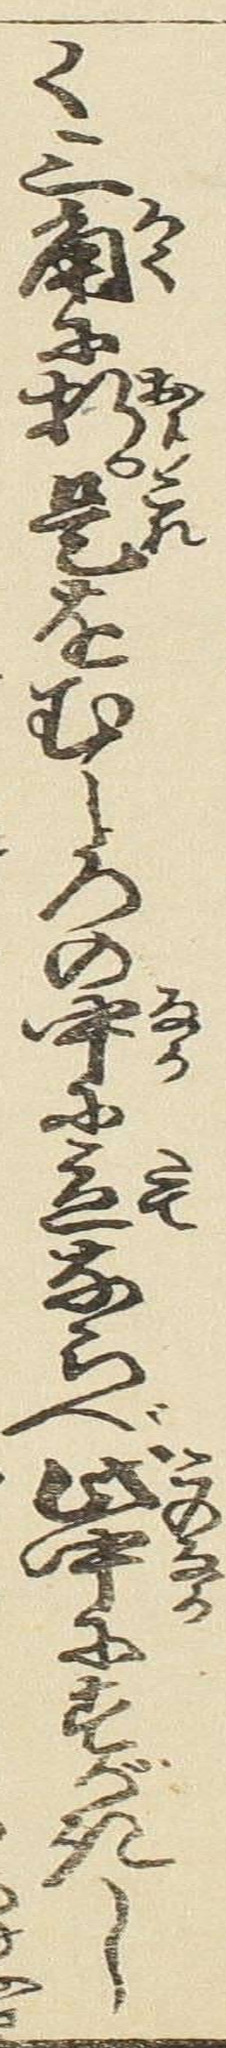く三角に折。是をむしろの中に立ならべ此中にすがきし
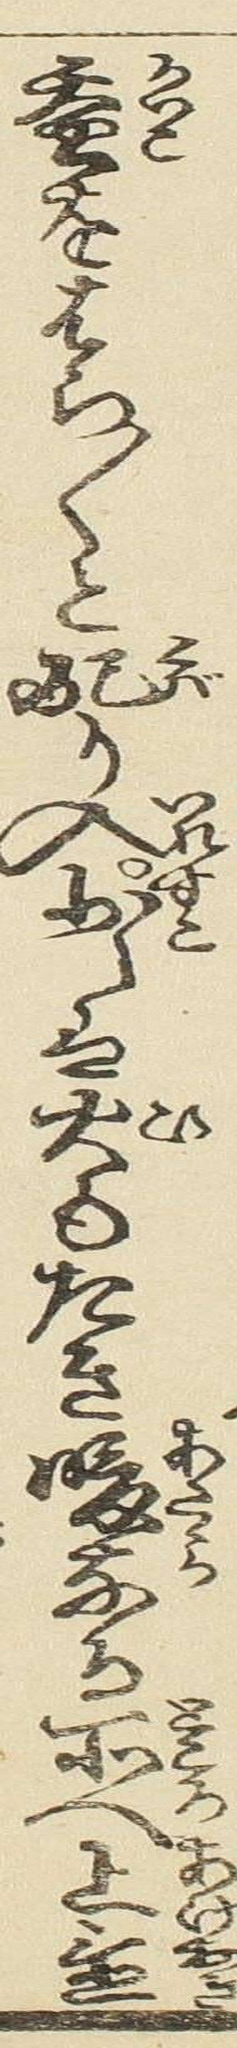蚕をはら〳〵と配り入。少しは火もたき暖なる所へ上置
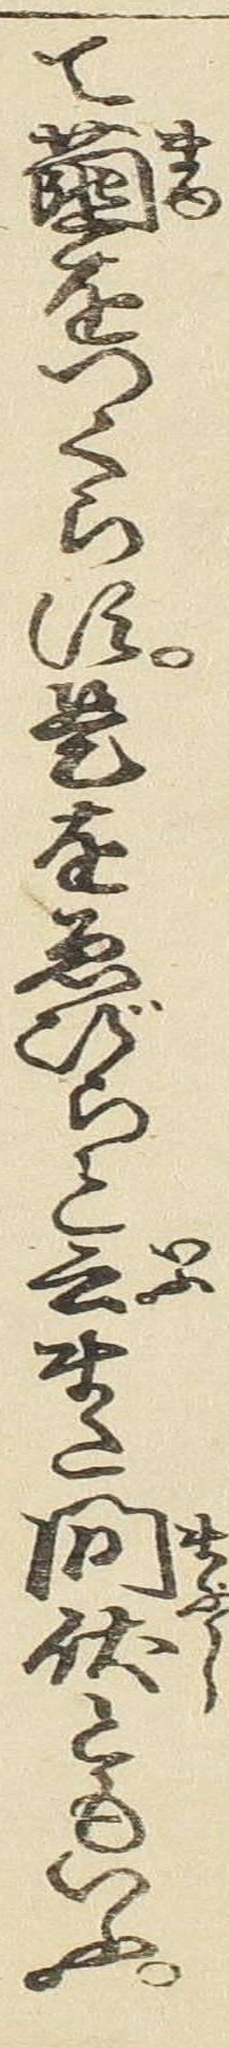て繭をつくらす。是をゑびらと云。また間伏ともいふ。
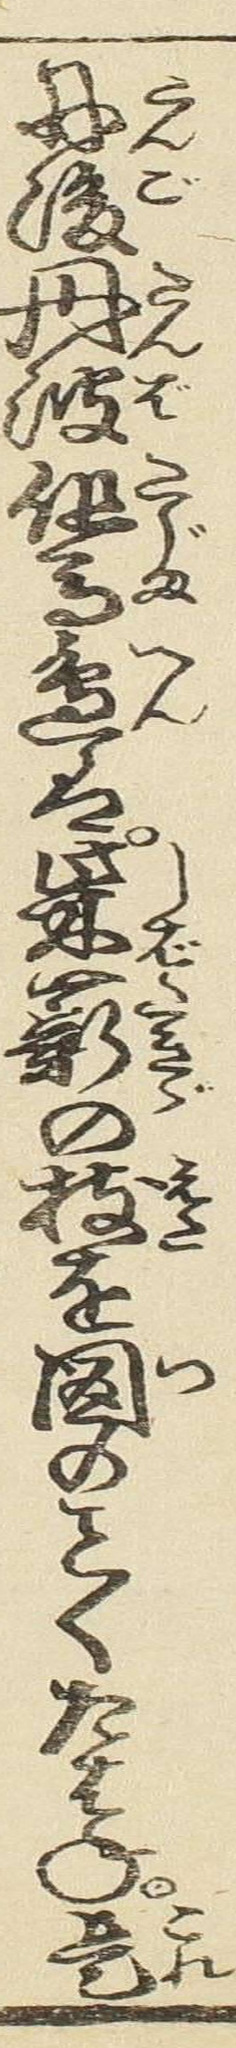丹後丹波但馬辺は。柴薪の枝を図のことくたはね⊙是
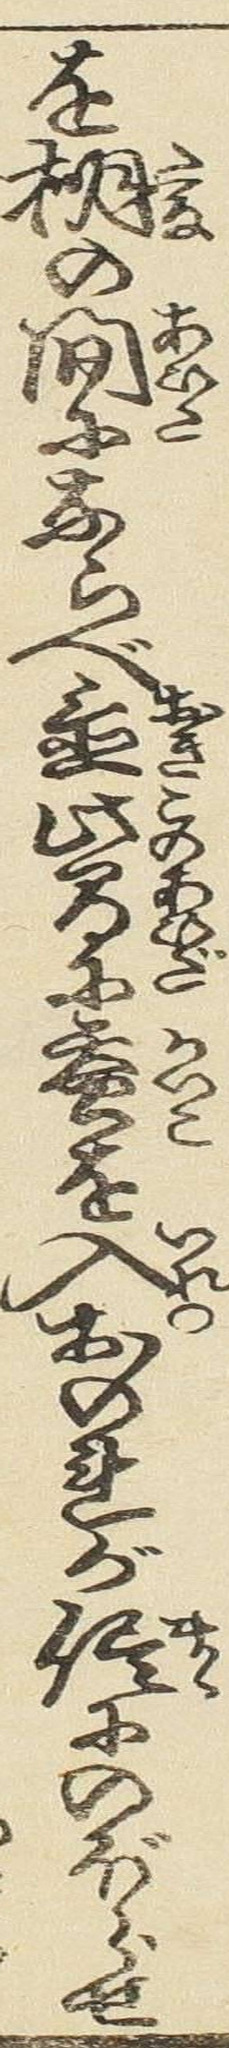を棚の間にならべ置此間に蚕を入。おのれが儘にのぼらせ
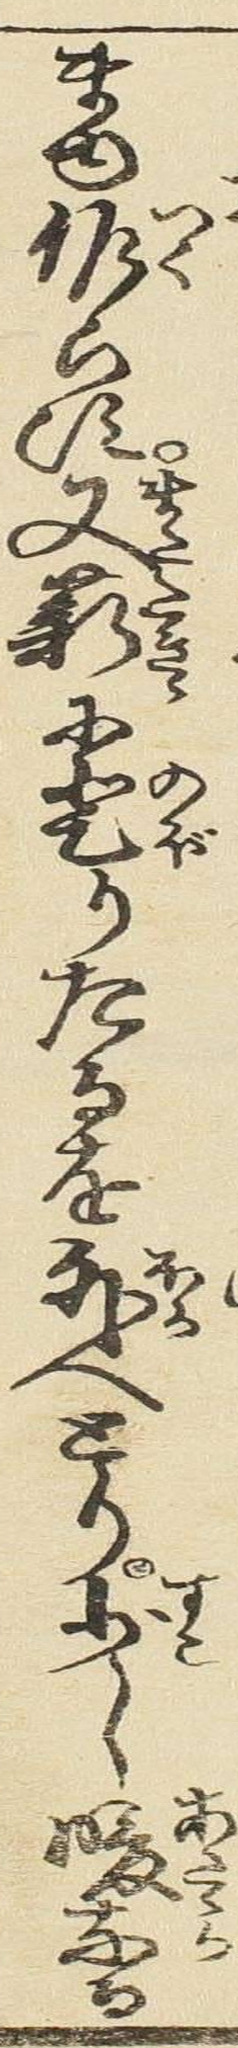まゆ作らす。又薪に登りたるを外へとり⊙少し暖なる
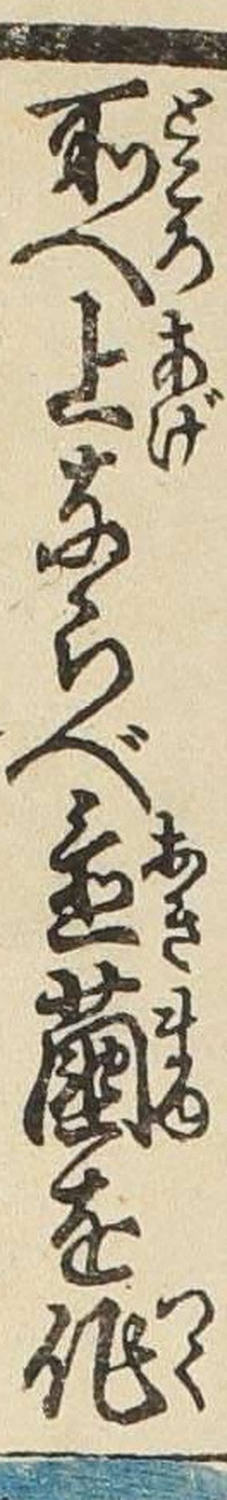所へ上ならべ置繭を作
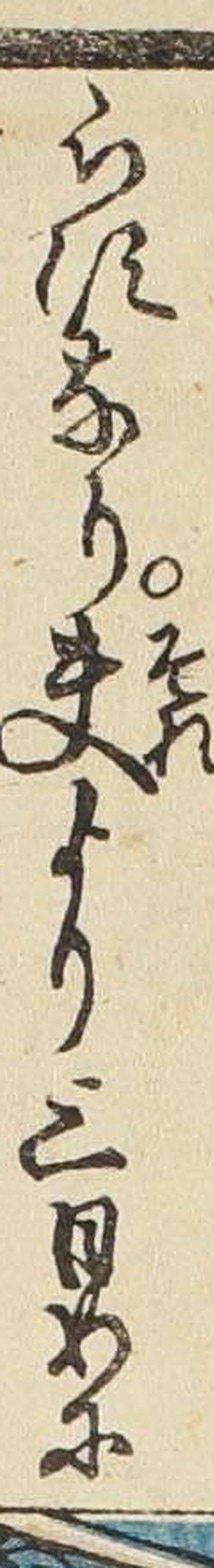らすなり。夫より三日めに
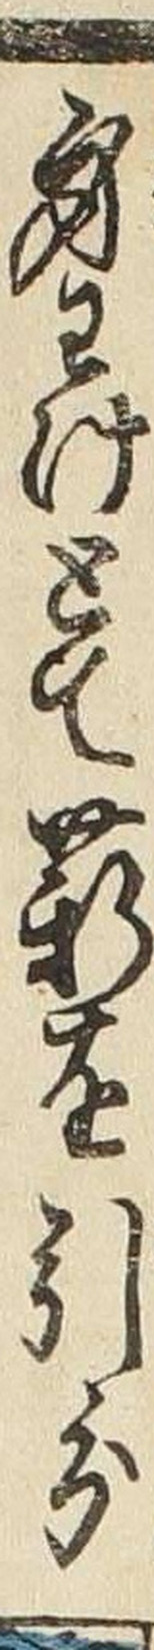身わけとて薪を引分
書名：養蠶圖解
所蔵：東京大学農学生命科学図書館 国文学研究資料館
